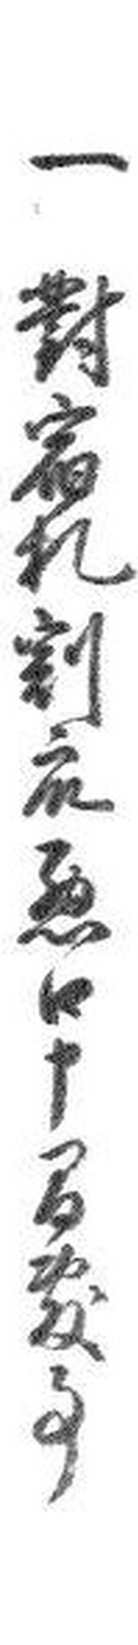一対宿札割衆悪口申間敷事
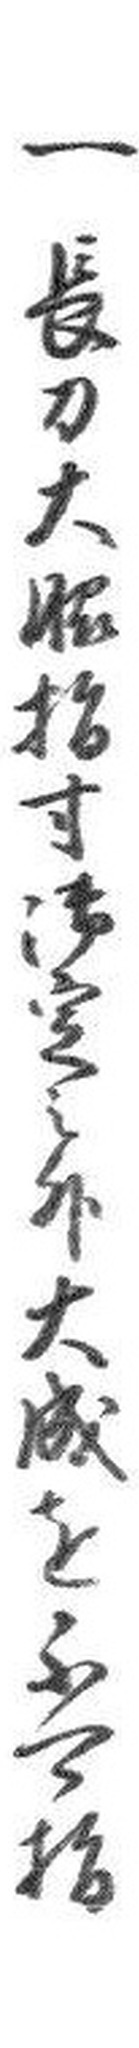一長刀大脇指寸御定之外大成を不可指
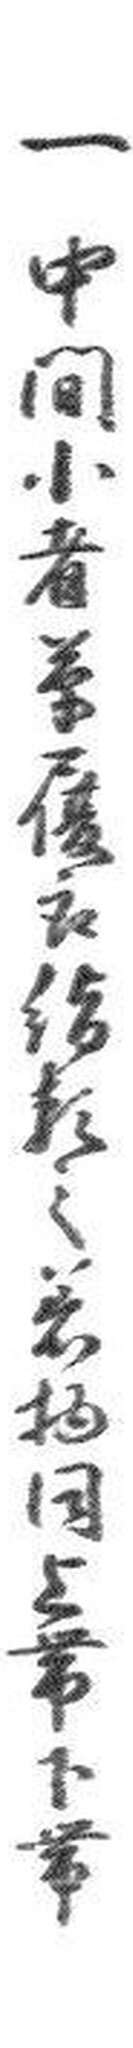一中間小者草履取絹類之着物同上帯下帯
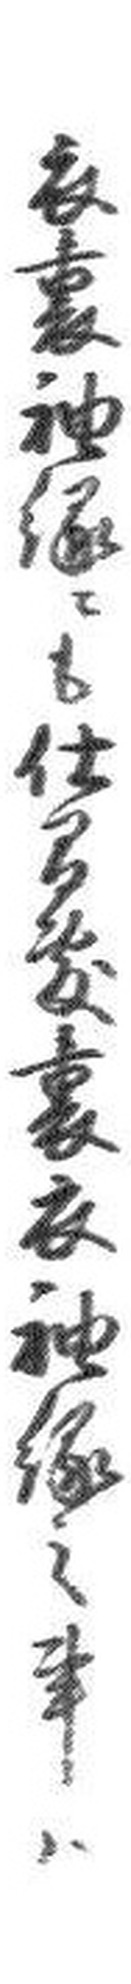衣裏袖縁ニも仕間敷裏衣袖縁之事ハ
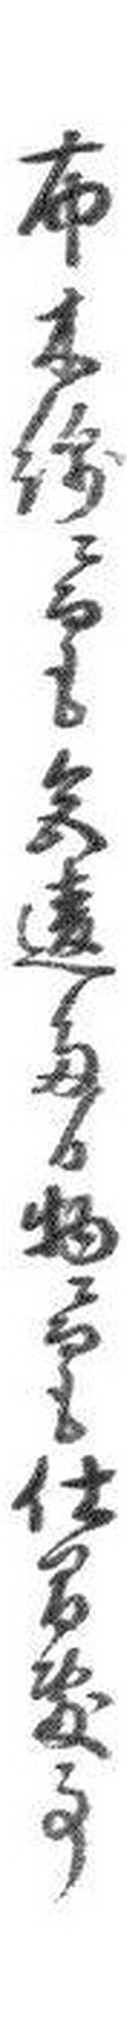布木綿ニ而も色違たる物ニ而も仕間敷事
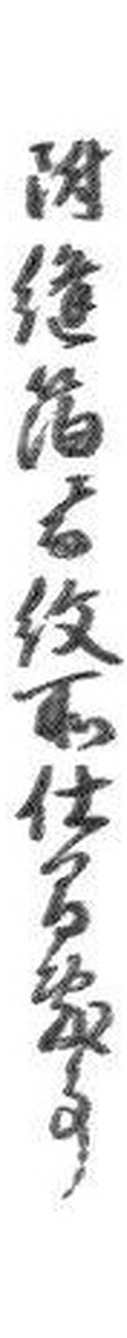附縫箔ニ而紋所仕間敷事
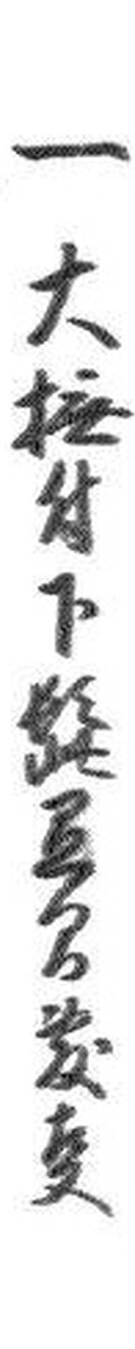一大撫付下髭宜間敷事
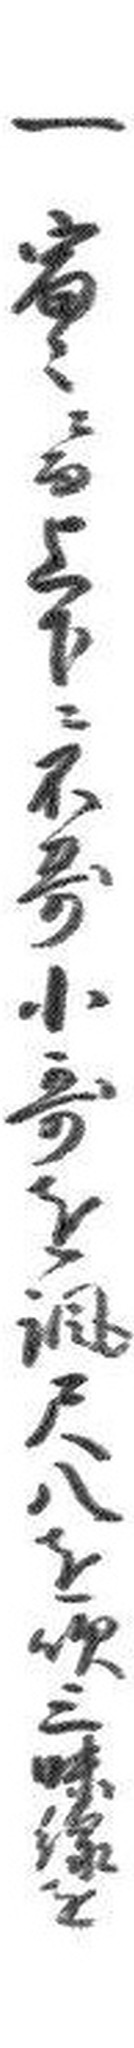一宿々ニ而上下ニ不寄小歌を諷尺八を吹三味線を

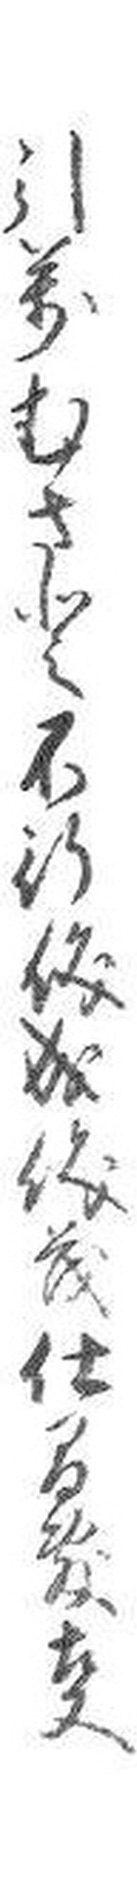引萬むさと不行儀成儀も仕間敷事
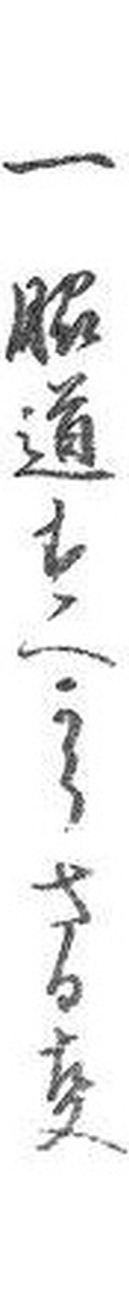一脇道すへからさる事
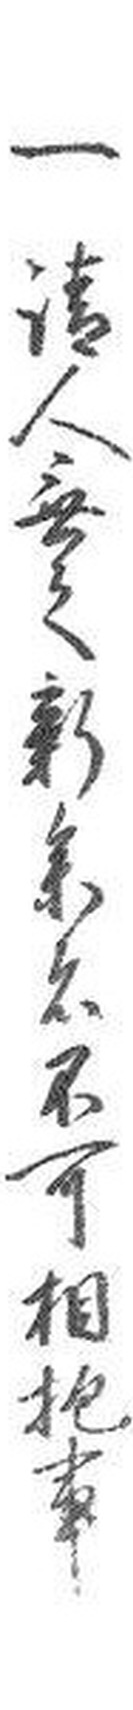一請人無之新参者不可相抱事
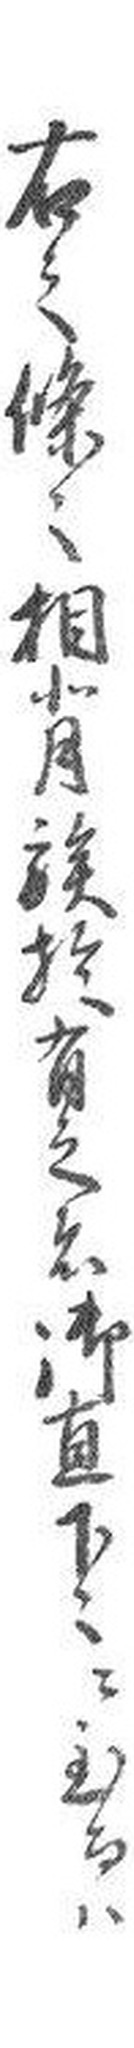右之条々相背族於有之者御直下々ニ至而ハ
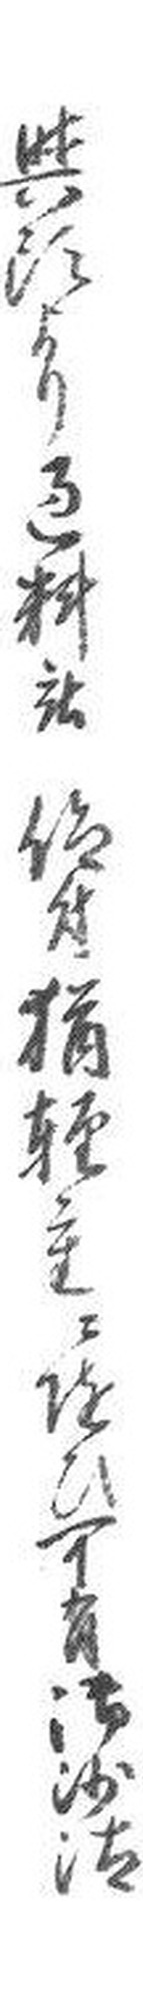與頭より過料被仰付猶軽重ニ随ひ可有御沙汰
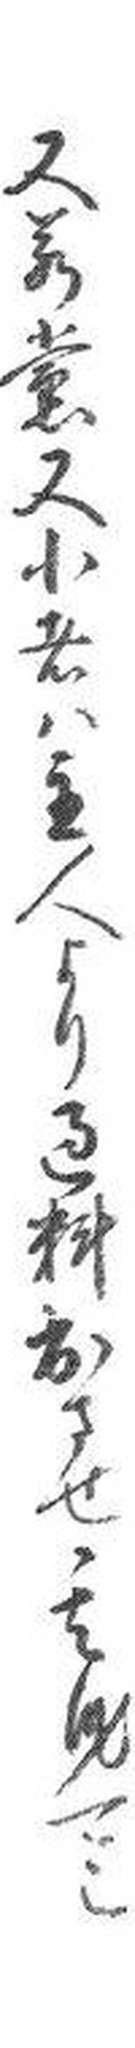又若党又小者ハ主人より過料出させ其身可被
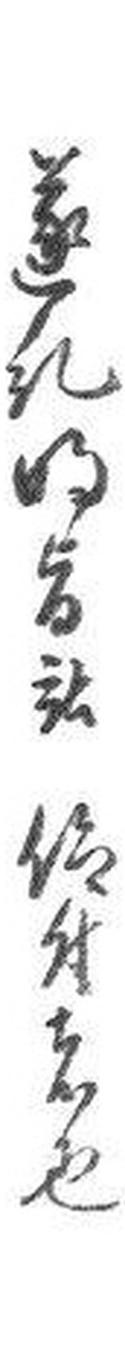遂糺明旨被仰付者也
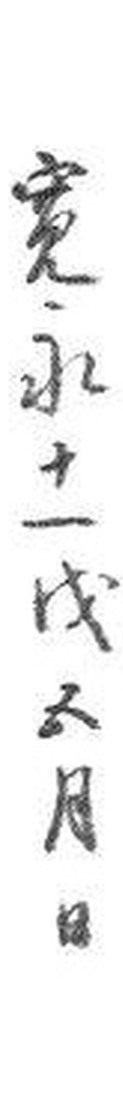寛永十一戊五月日
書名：家譜 四 忠昌公 従寛永七年到正保四年
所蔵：福井県文書館 Fukui Prefectural Archives
